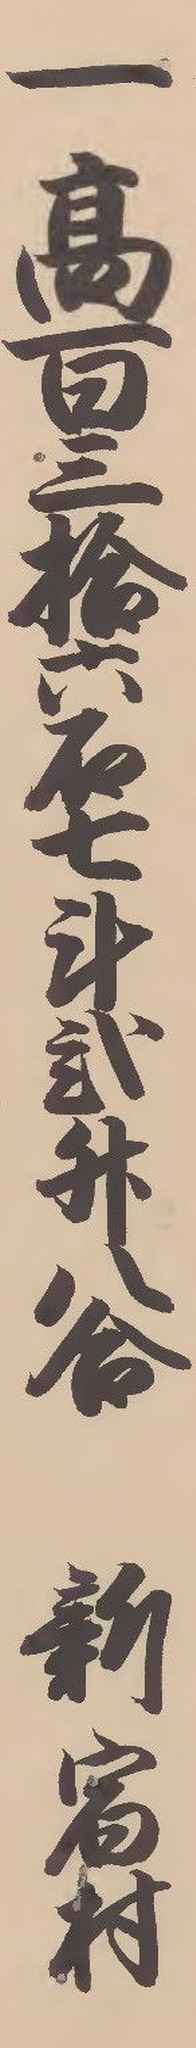一高百三拾六石七斗弐升八合新宿村
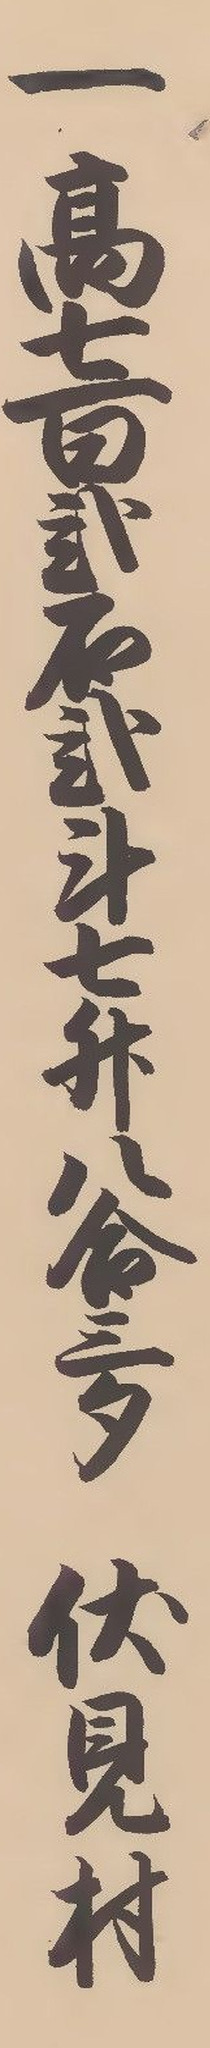一高七百弐石弐斗七升八合三勺伏見村
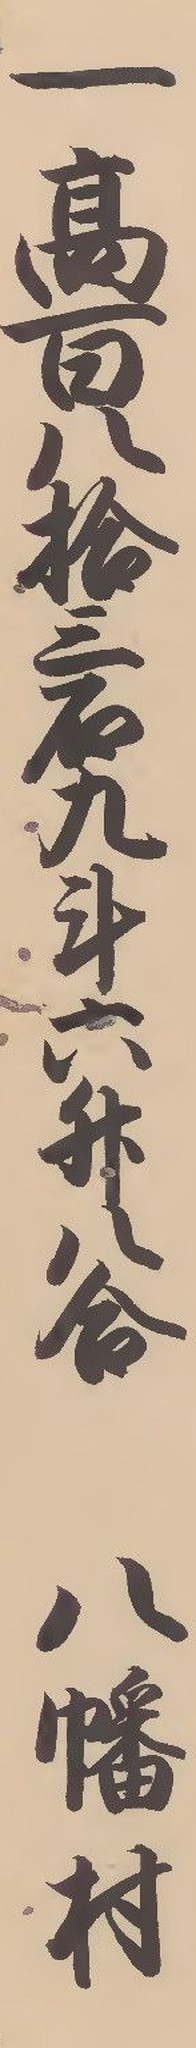一高百八拾三石九斗六升八合八幡村

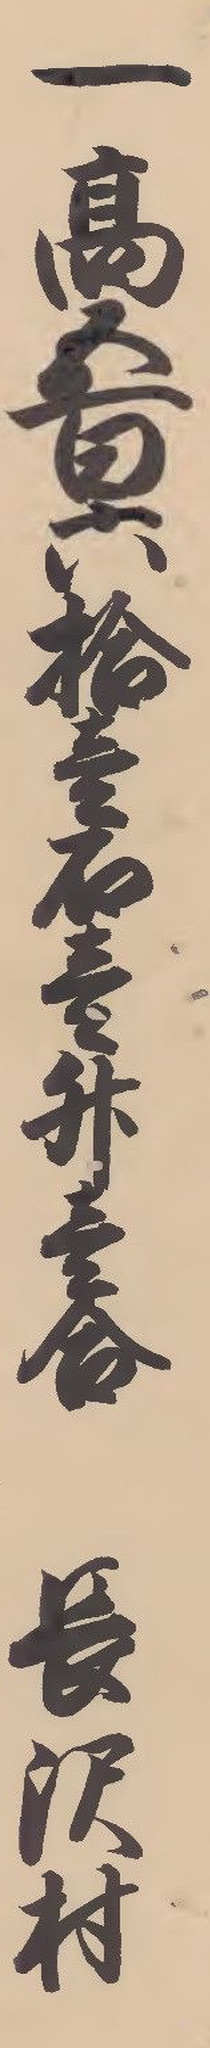一高五百六拾壱石壱升壱合長沢村
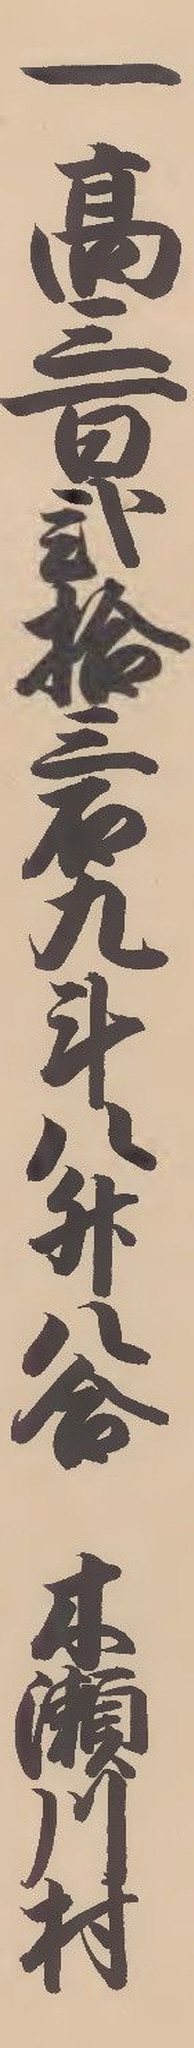一高三百弐拾三石九斗八升八合木瀬川村
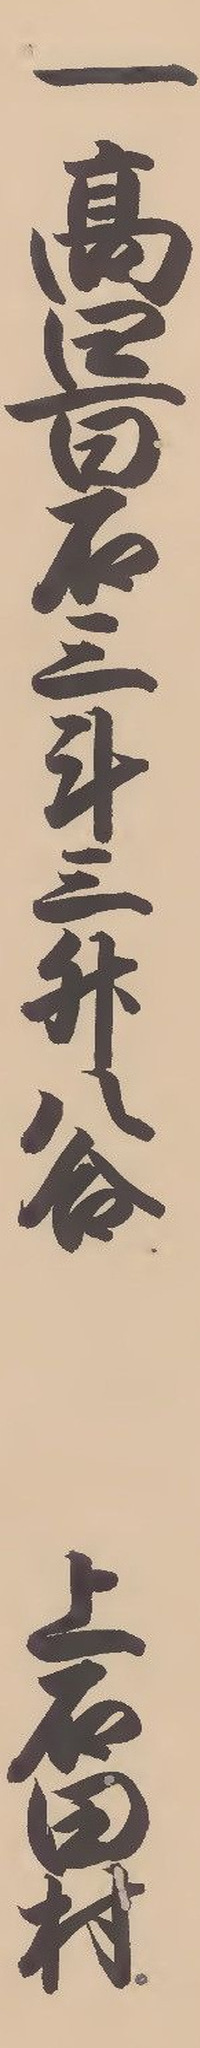一高四百石三斗三升八合上石田村
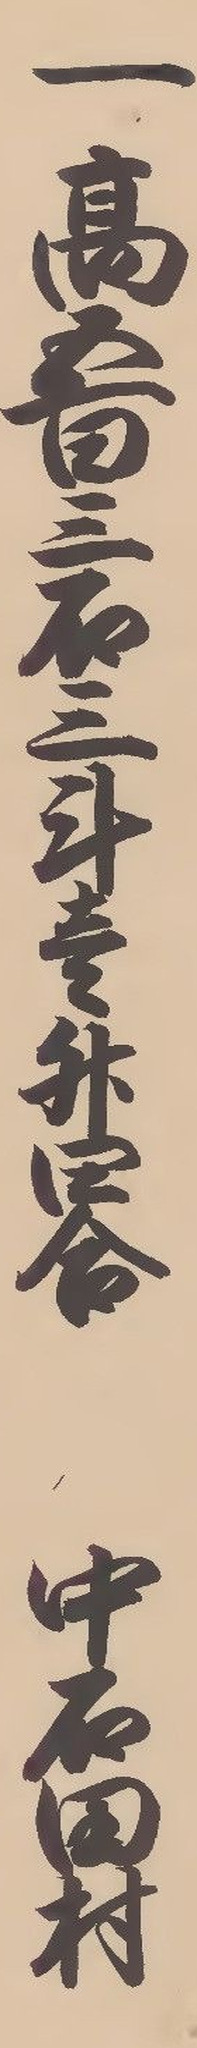一高五百三石三斗壱升四合中石田村
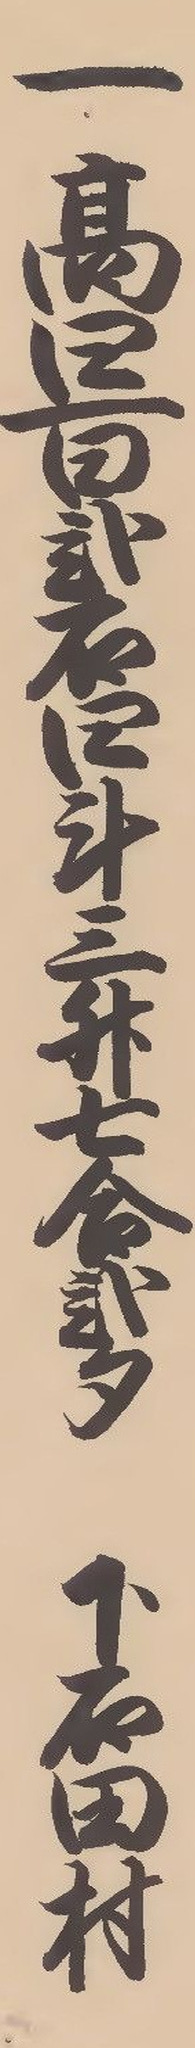一高四百弐石四斗三升七合弐勺下石田村
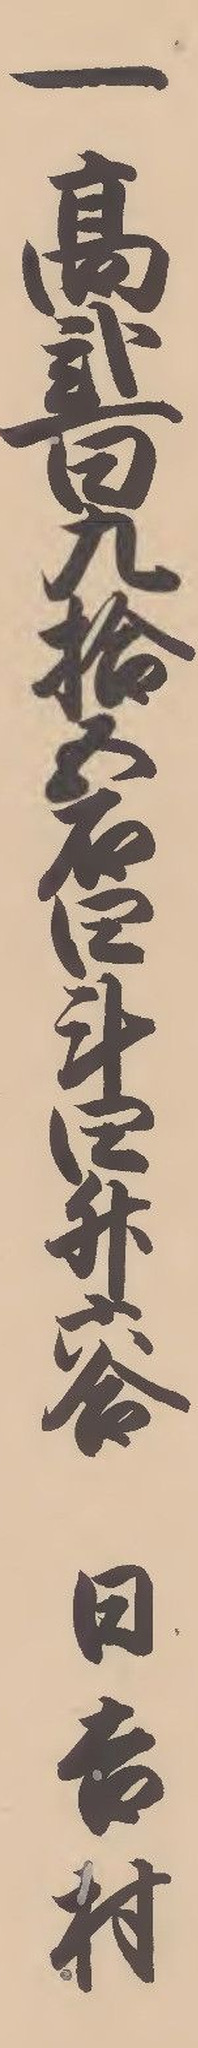一高弐百九拾五石四斗四升六合日吉村
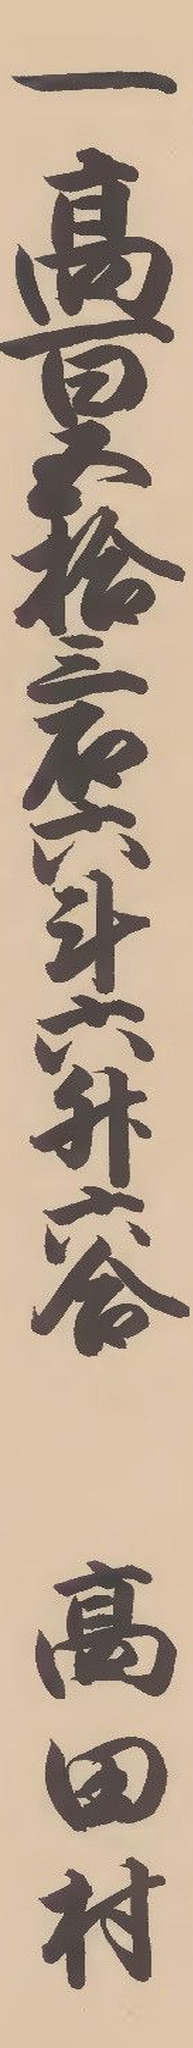一高百五拾三石六斗六升六合高田村
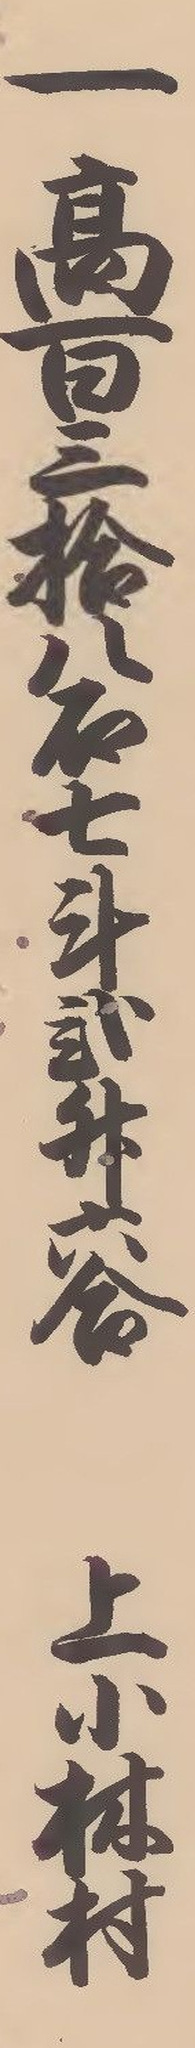一高百三拾八石七斗弐升六合上小林村

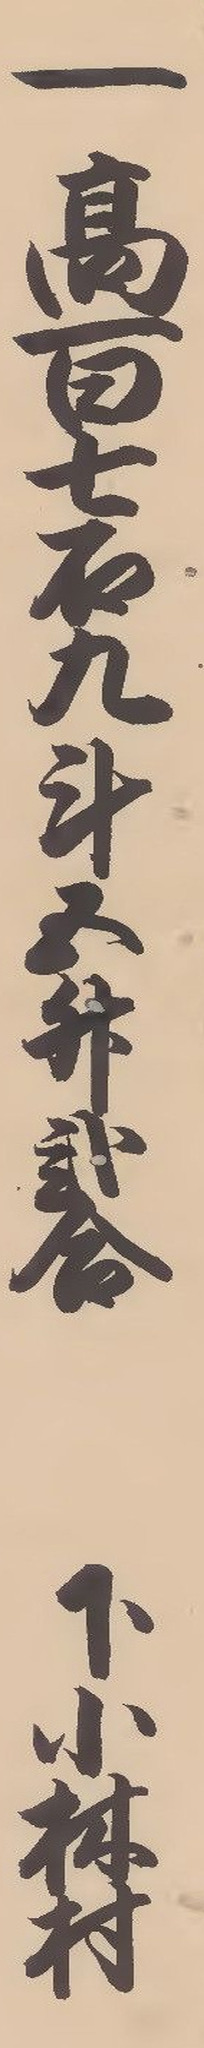一高百七石九斗五升弐合下小林村
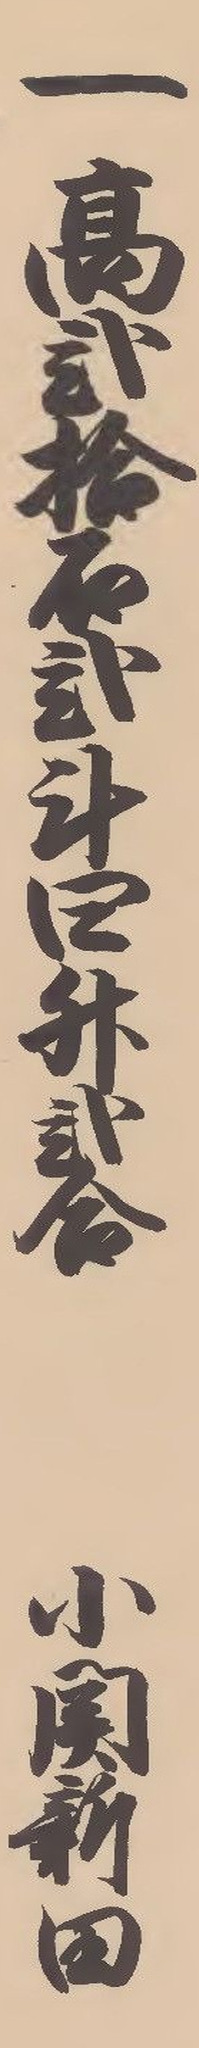一高弐拾石弐斗四升弐合小関新田
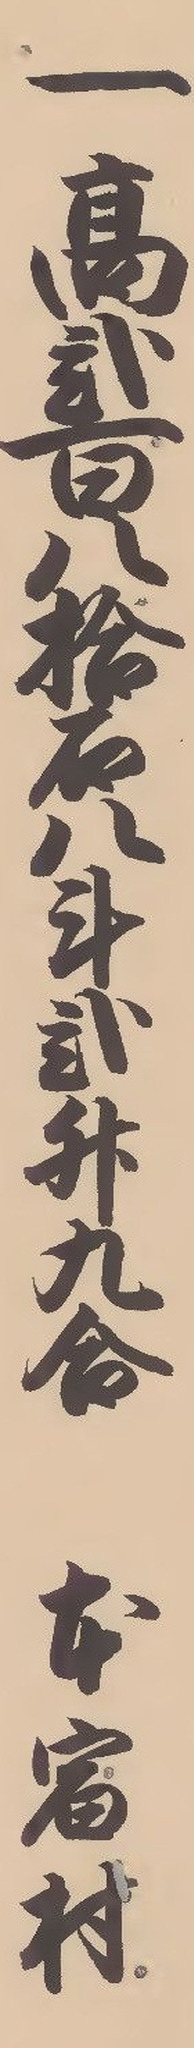一高弐百八拾石八斗弐升九合本宿村
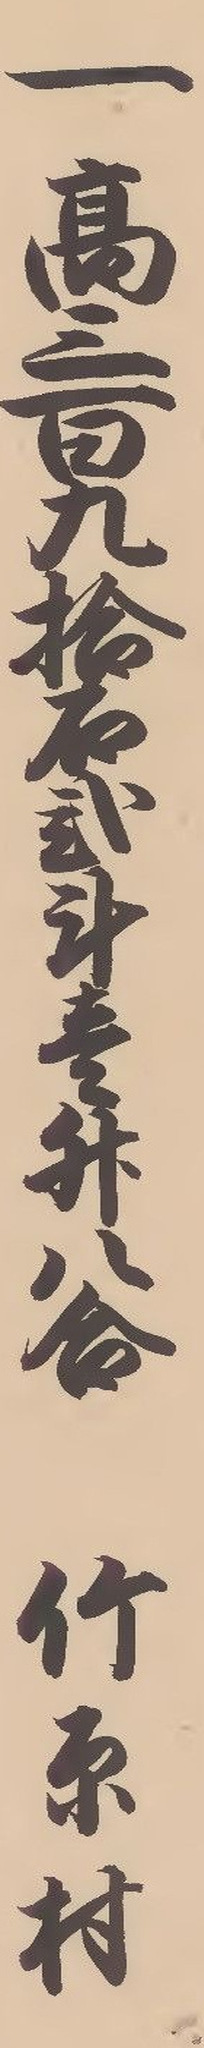一高三百九拾石弐斗壱升八合竹原村
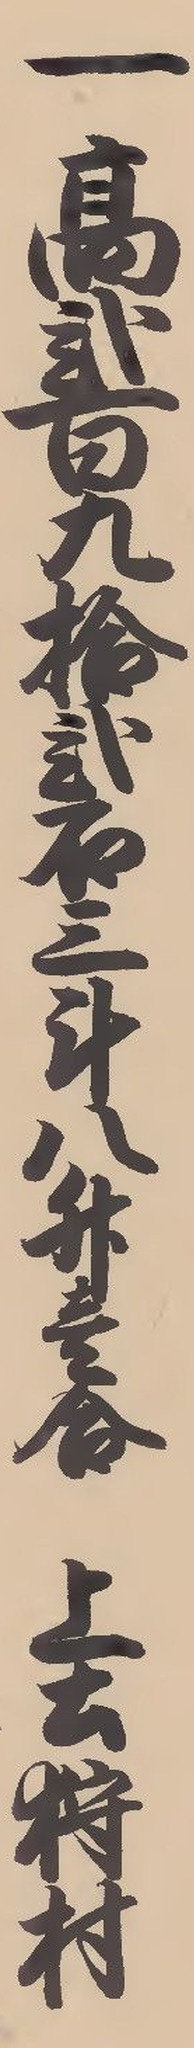一高弐百九拾弐石三斗八升壱合上土狩村
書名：駿河国郷帳
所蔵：国立公文書館 National Archives of Japan
